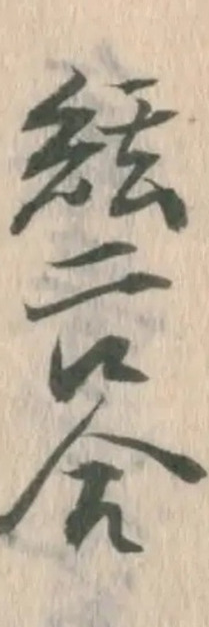絃二口合
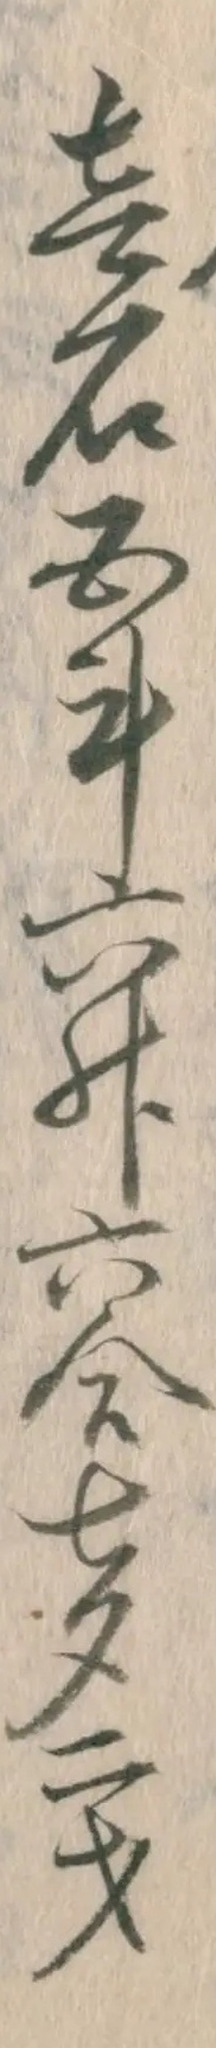壱石五斗六升六合七勺二才
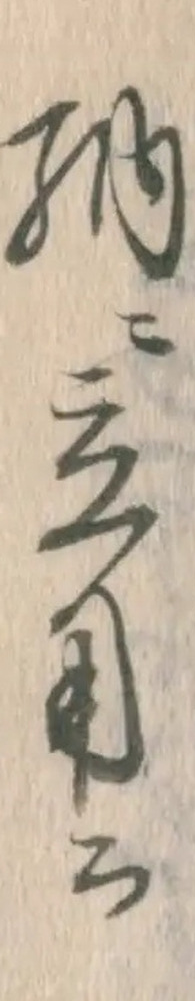納ニ立用〆
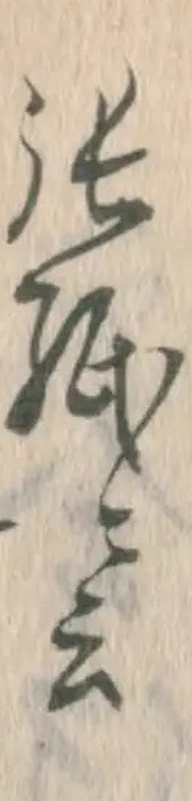張紙に云
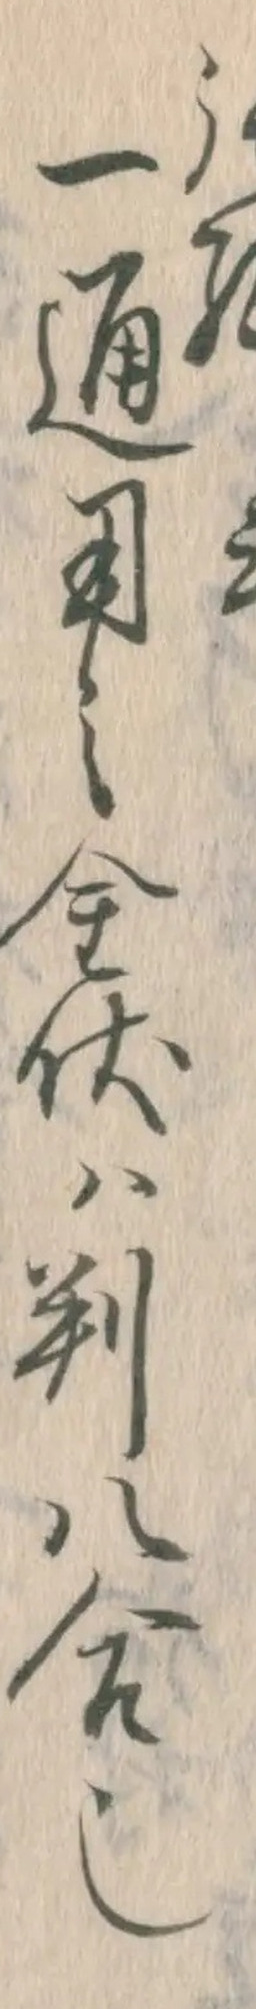一通用之金伏は判八合也
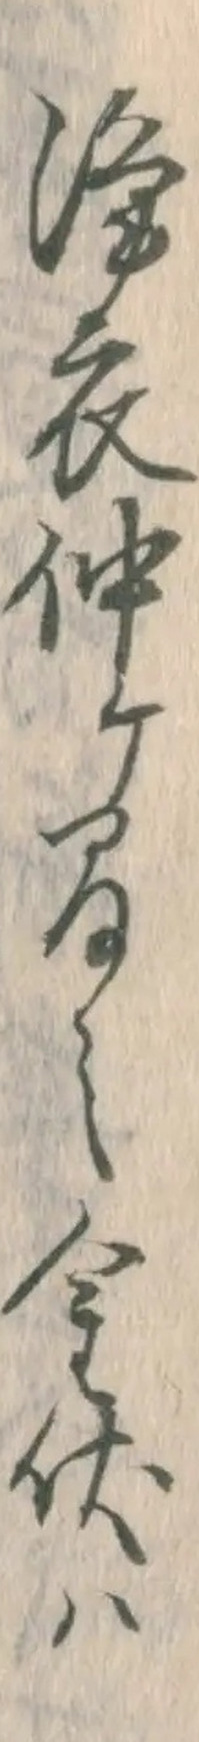浄衣仲ヶ間之金伏は
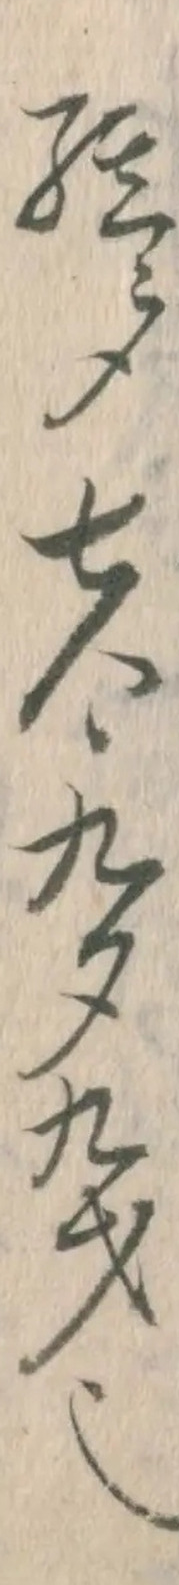弦ニシテ七合九勺九才也
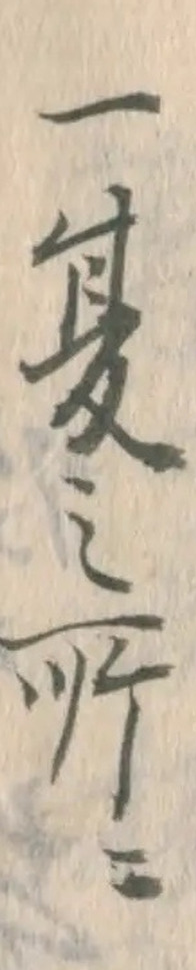一夏之所に
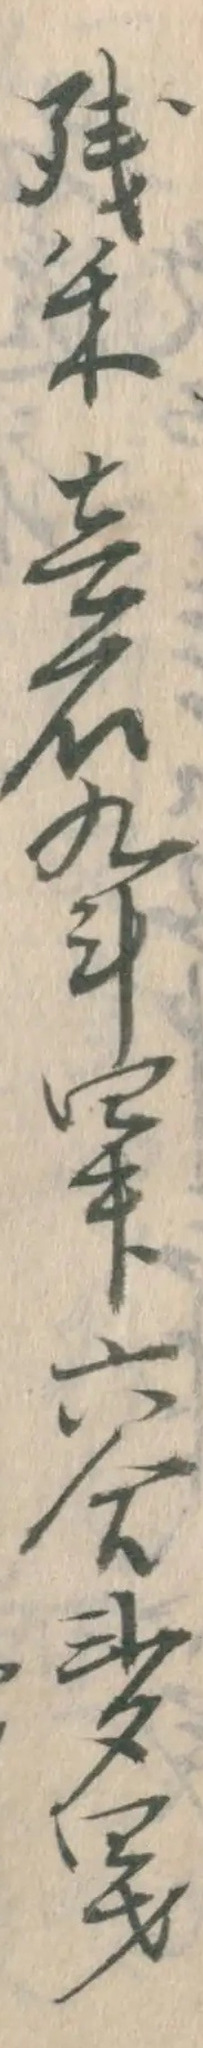残米壱石九斗四升六合弐勺四才

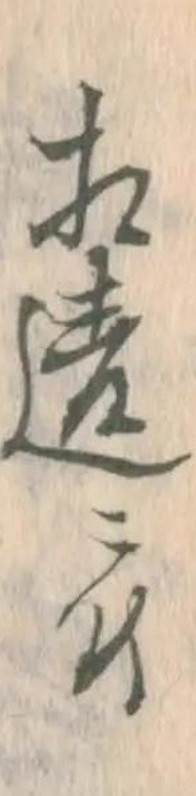相違に付
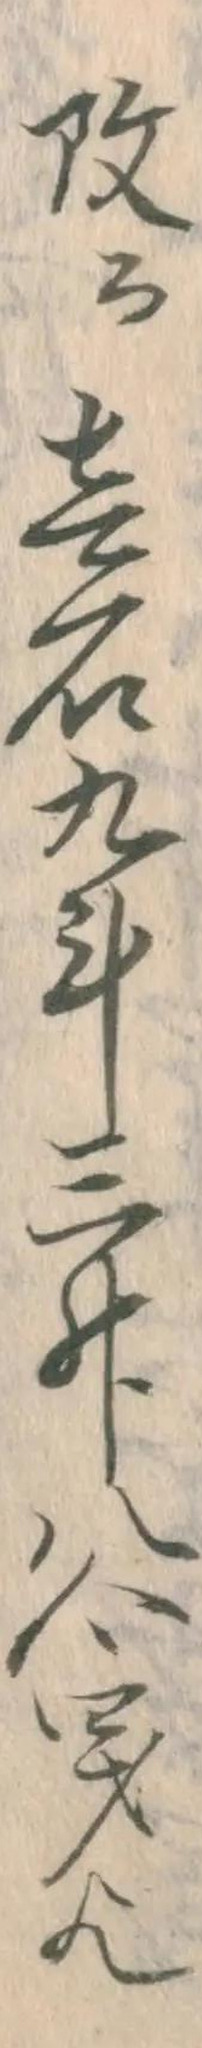改而壱石九斗三升八合四才歟
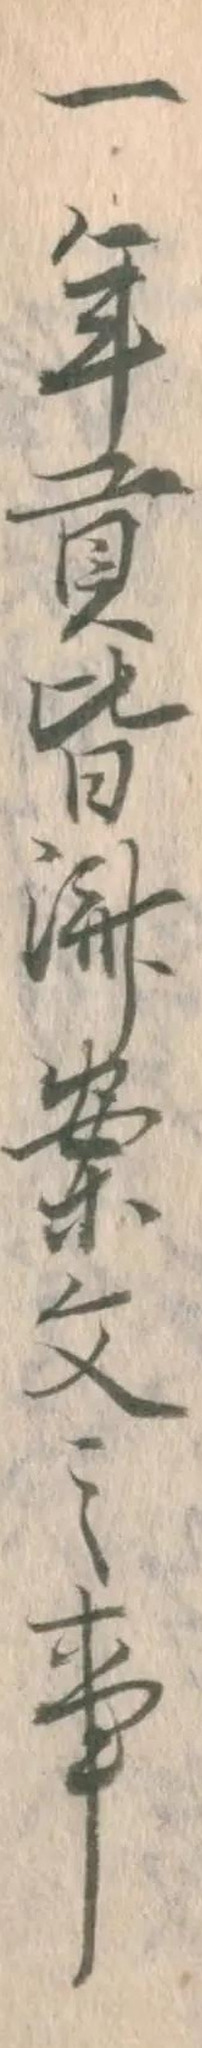一年貢皆済案文之事
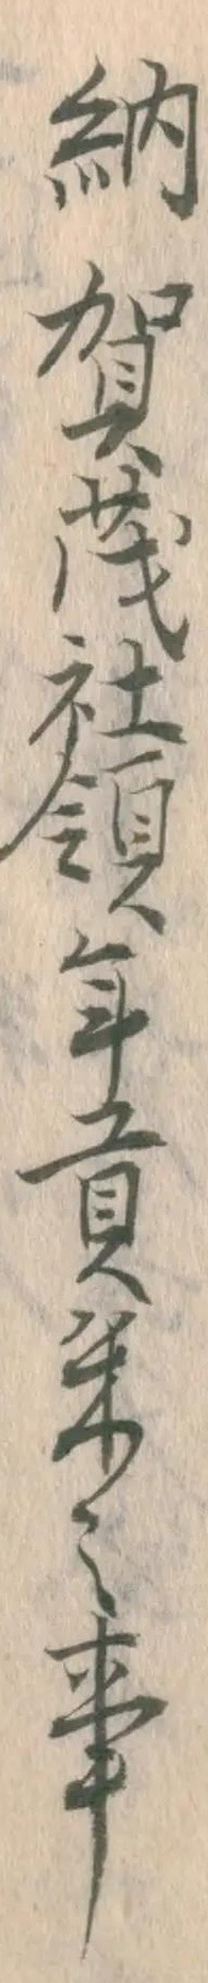納賀茂社領年貢米之事
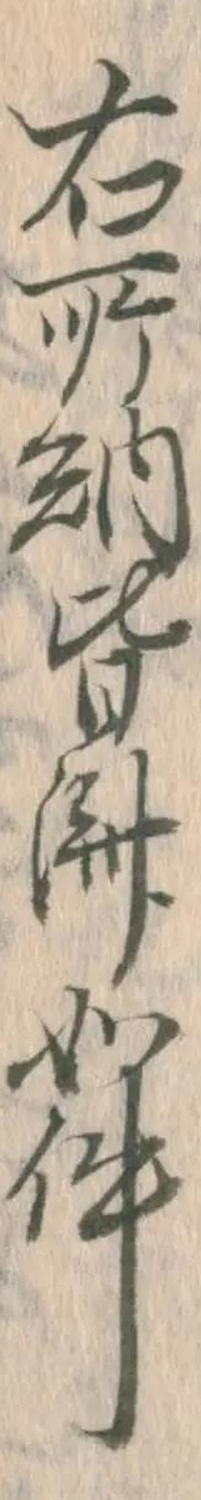右所納皆済如件
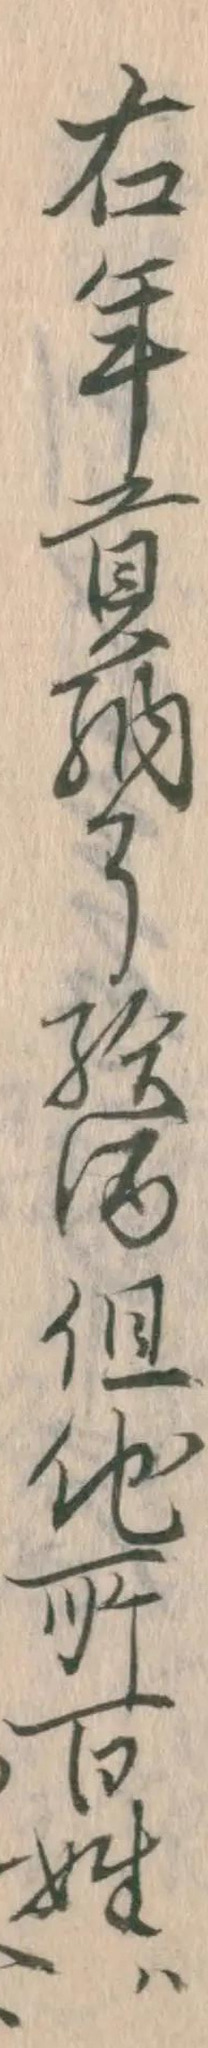右年貢納了給酒但地所百姓は
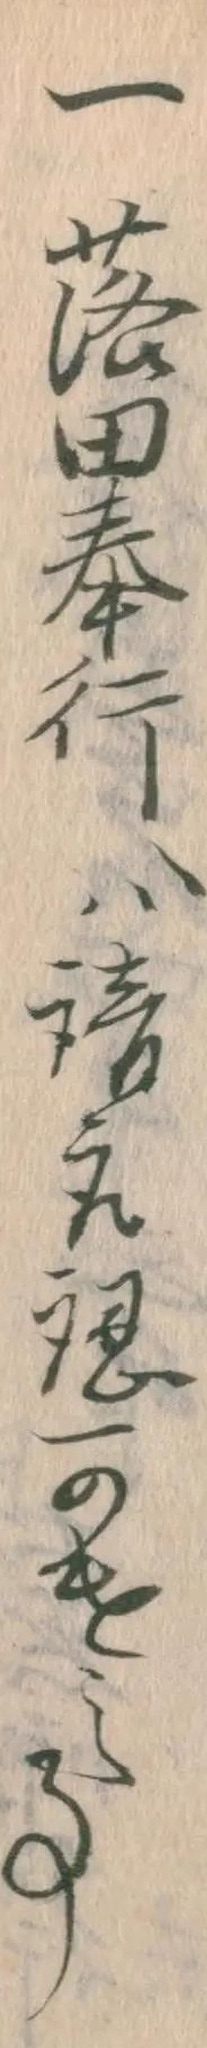一落田奉行へは請取認可遣之事
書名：賀茂社記録. 第81冊
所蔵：国立国会図書館 National Diet Library, JAPAN
